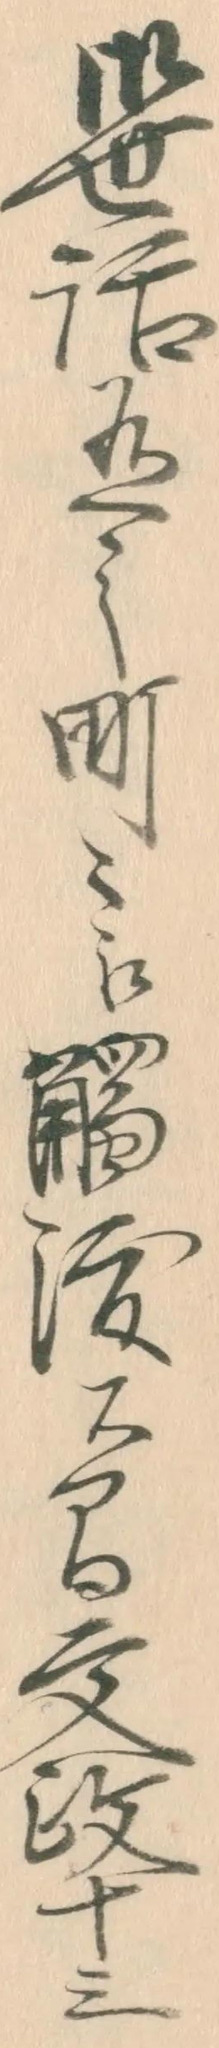御世話有之町々え触渡ス間文政十三
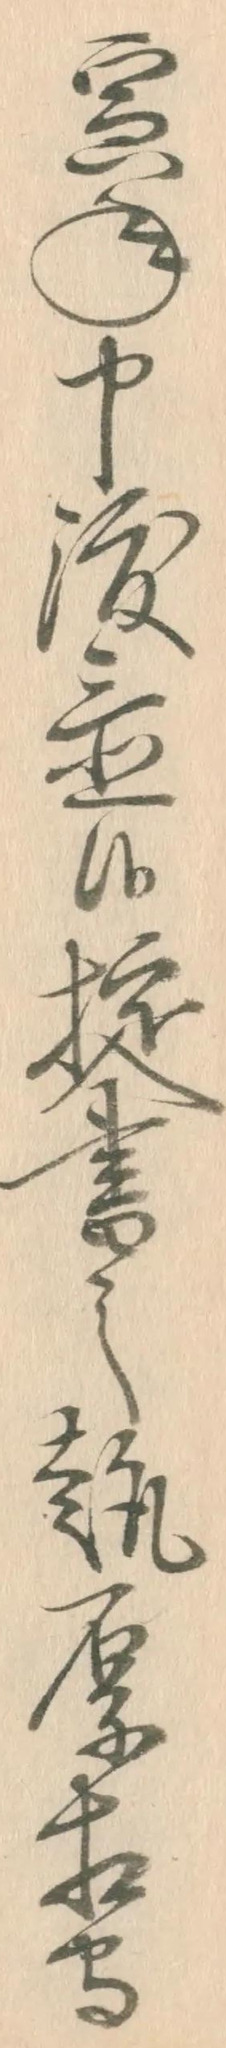寅年申渡置候掟書之趣厚相守
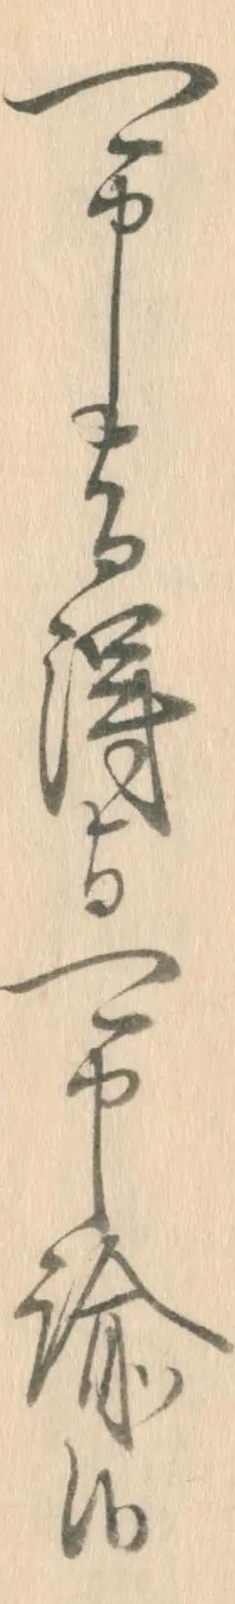可申旨得と可申諭候

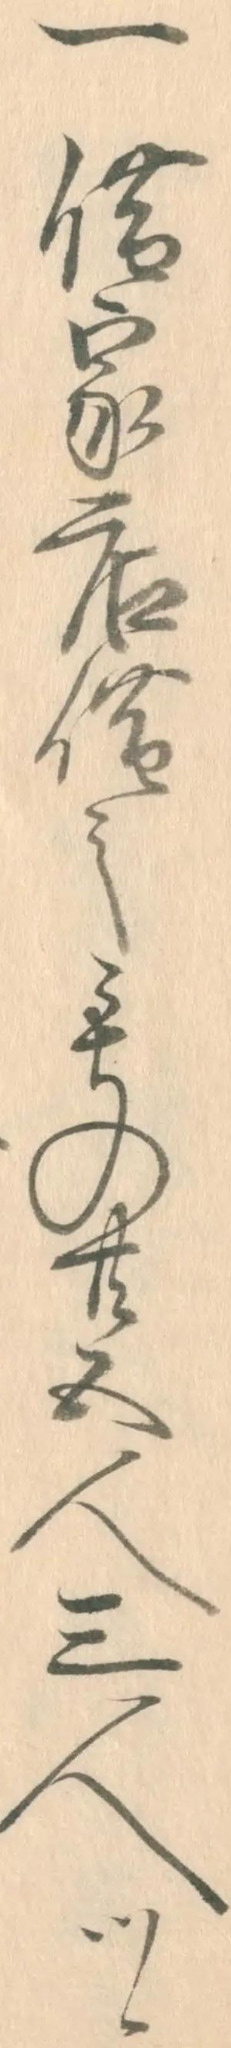一借家店借之もの共五人三人ツヽ
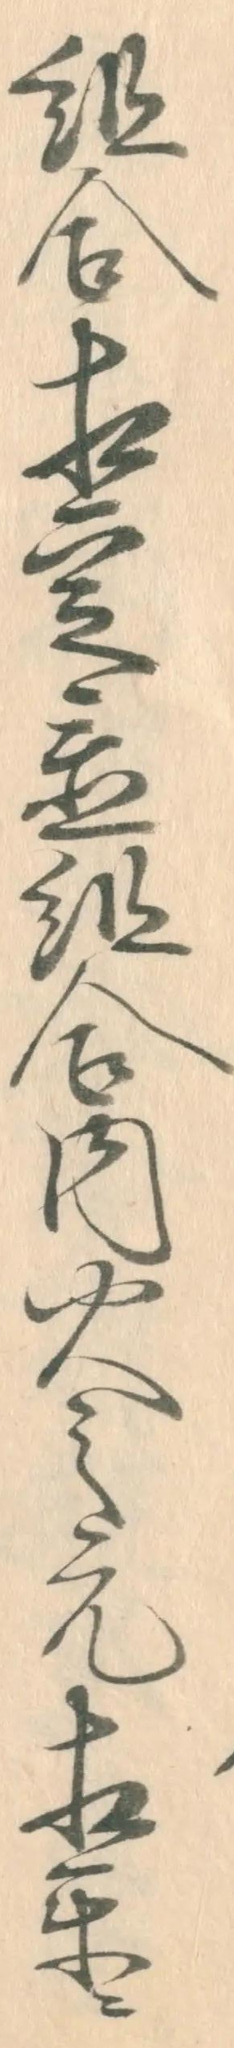組合相定置組合内火之元相互ニ
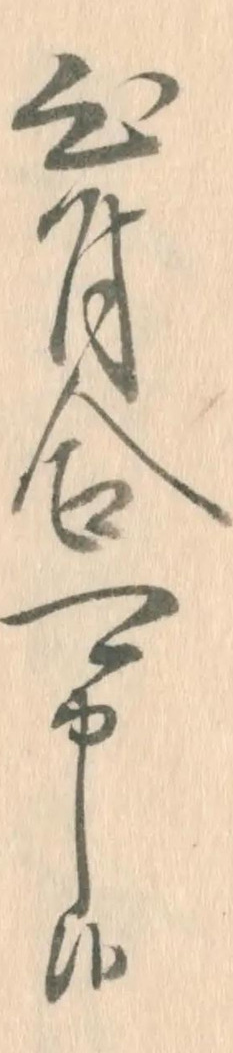心付合可申候
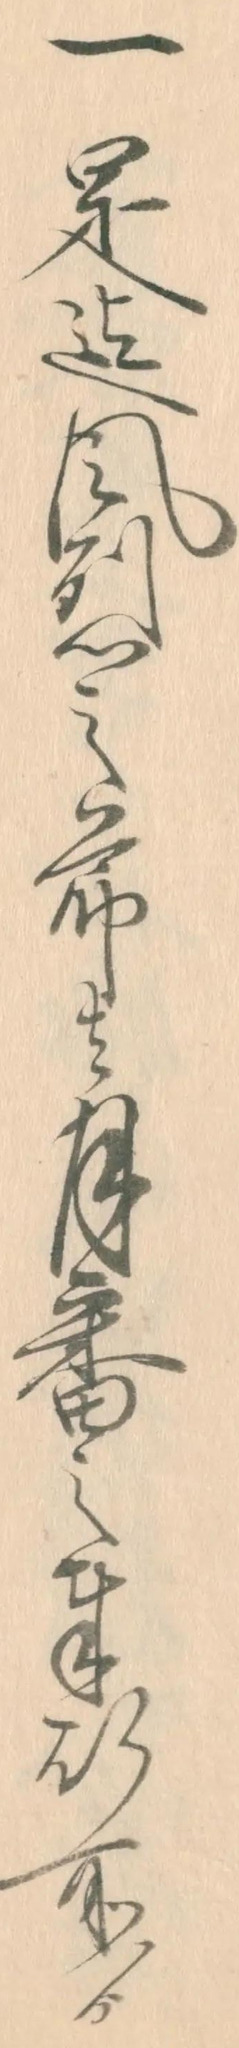一是迄風烈之節は月番之奉行所ゟ
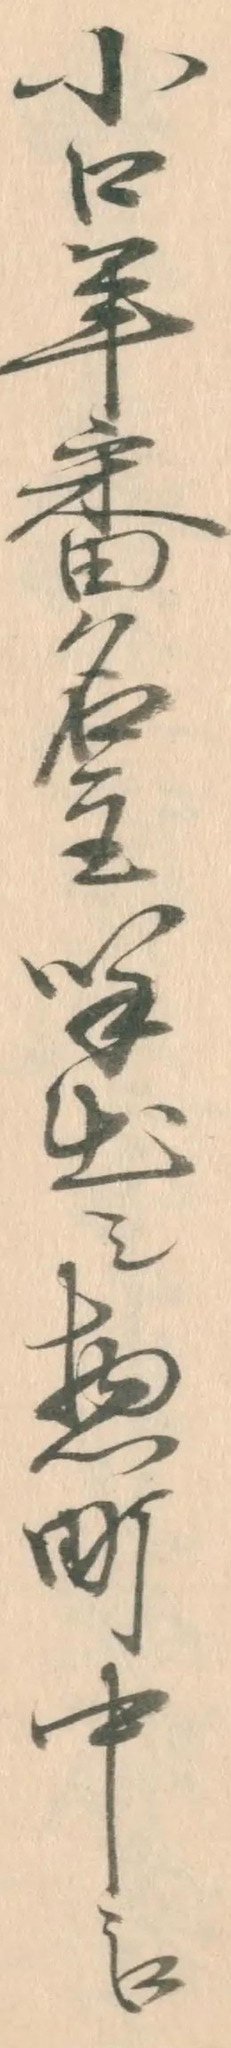小口年番名主呼出シ惣町中え
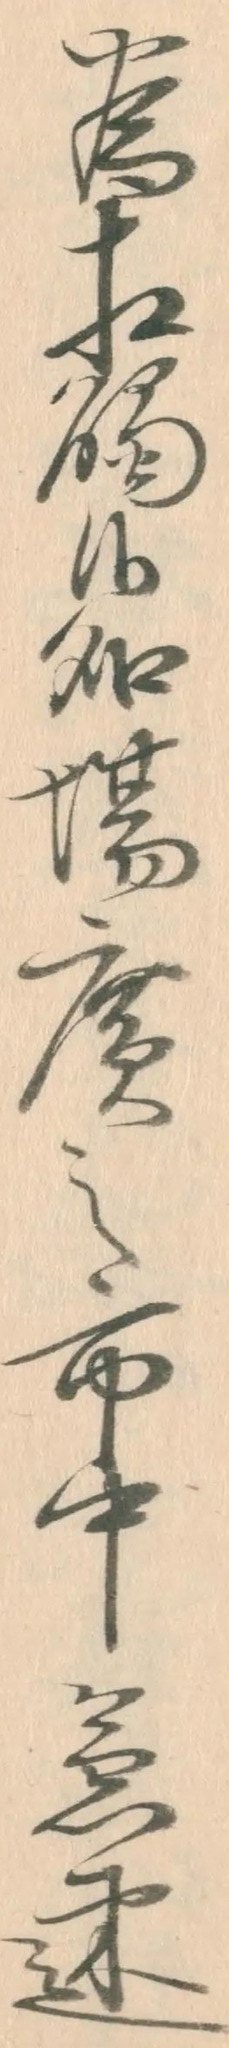為相触候処場広之市中急速
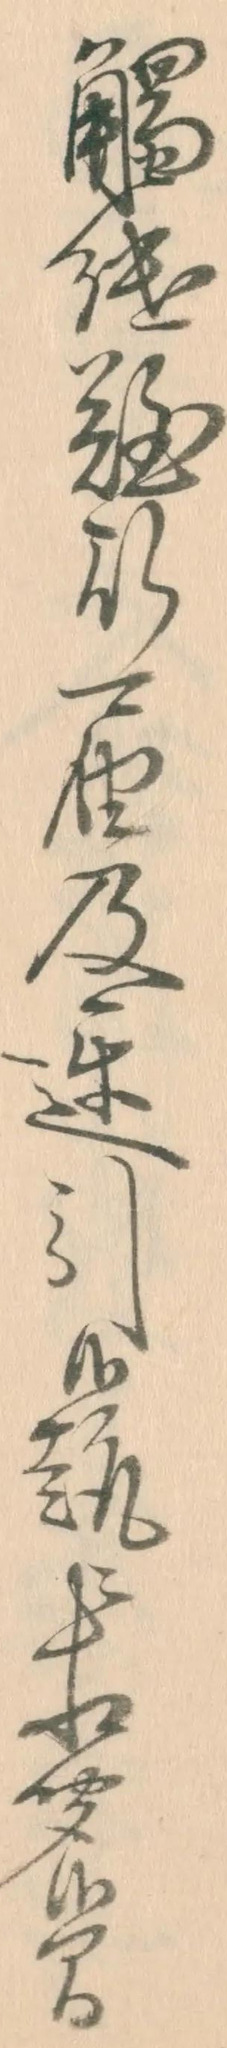触継難行届及遅引候趣ニ相聞候間
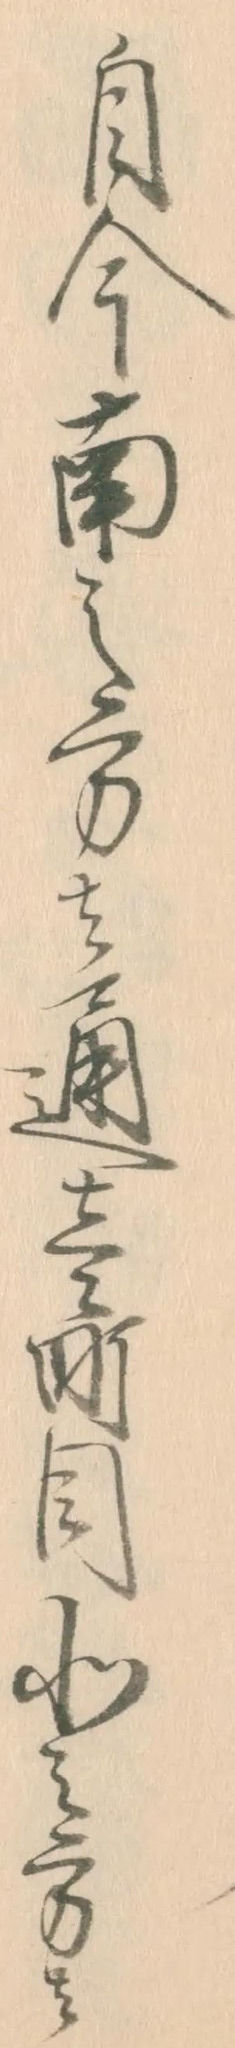自今南之方は通壱町目北之方は
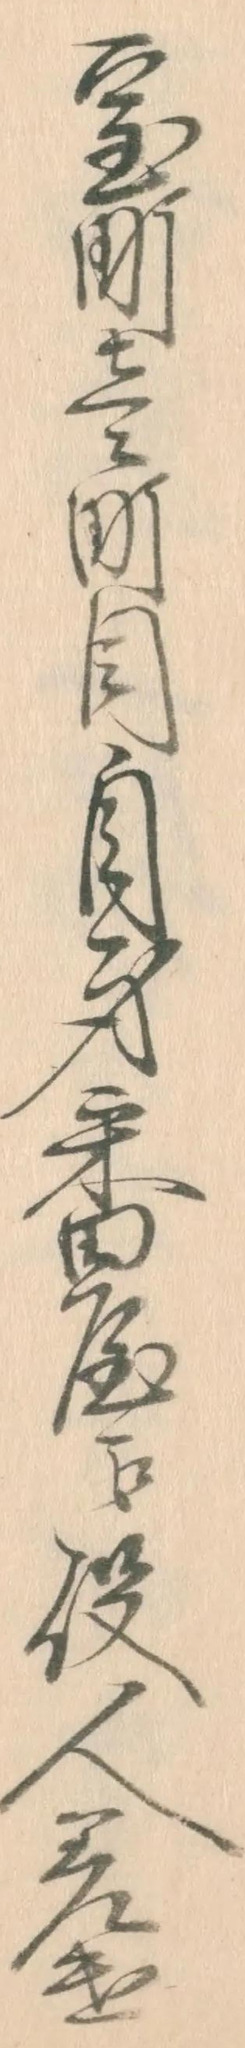室町壱町目自身番屋え役人差遣
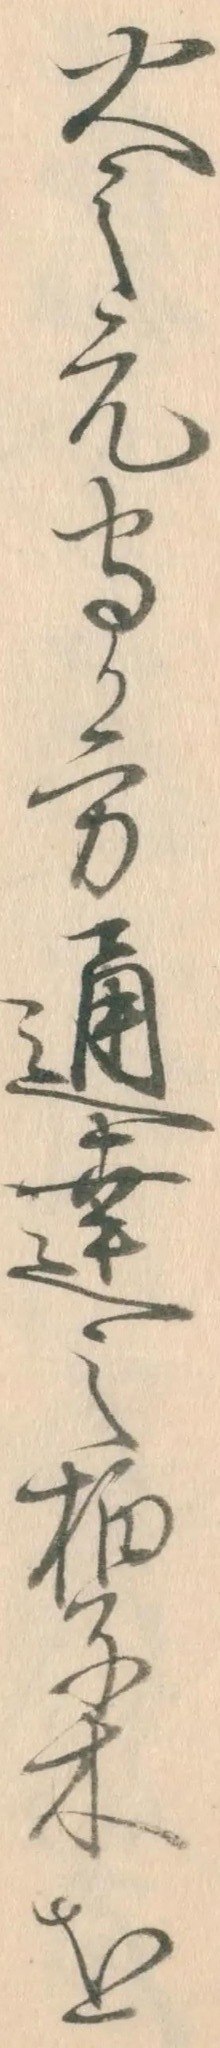火之元守り方通達之拍子木を
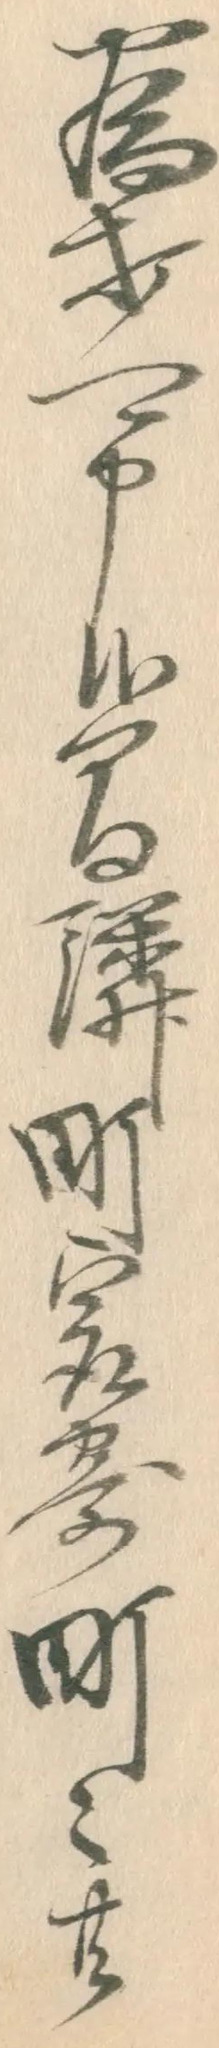為打可申候間隣町最寄町々共
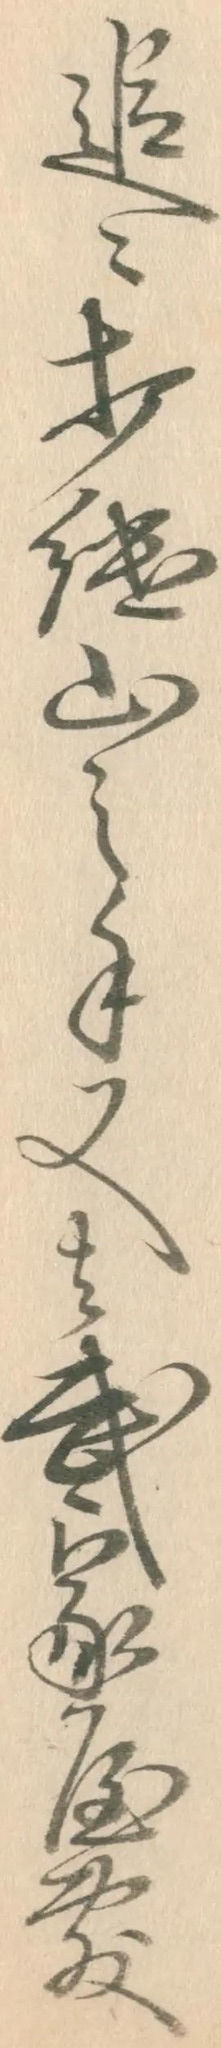追々打継山之手又は武家屋敷

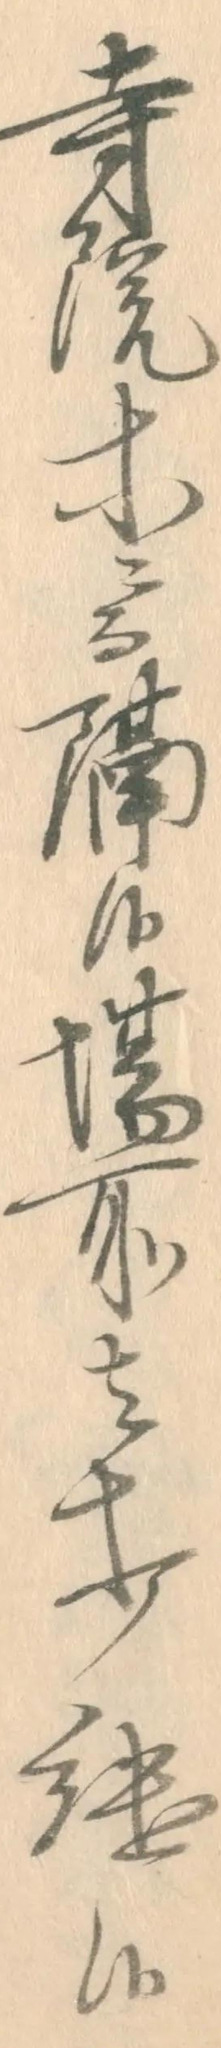寺院等ニ而隔候場所は打継候
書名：三橋 17巻. [7] 三橋小破御修復書留　但御奉行御掛リ替地震潰橋番屋　嘉永四亥年より安政二卯年迄　上
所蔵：国立国会図書館 National Diet Library, JAPAN
